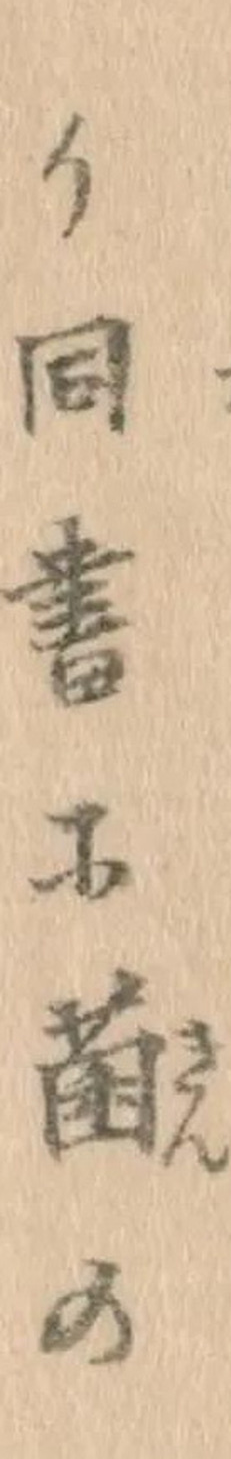り同書に菌の
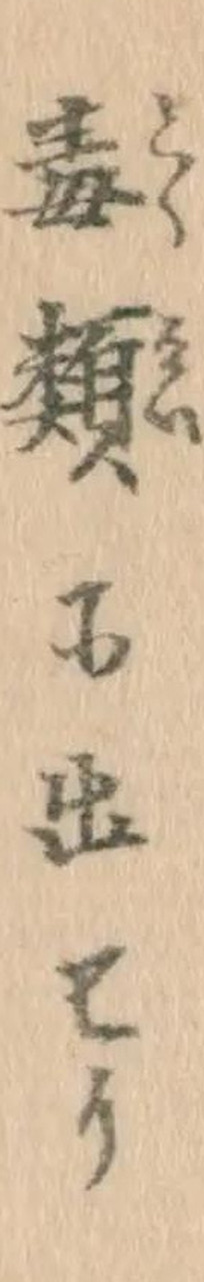毒類に出せり

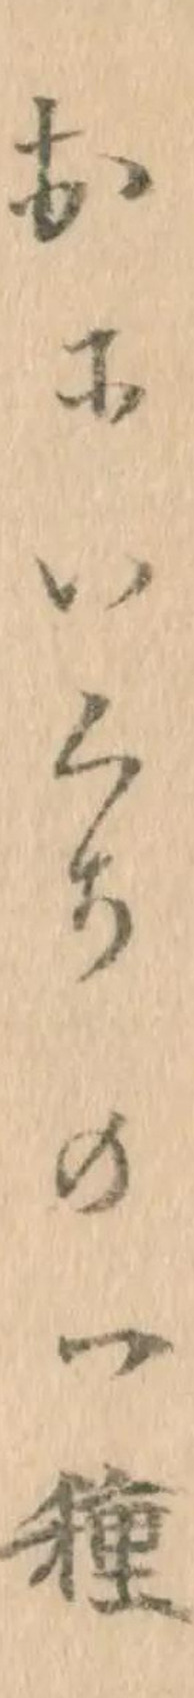おにいくちの一種
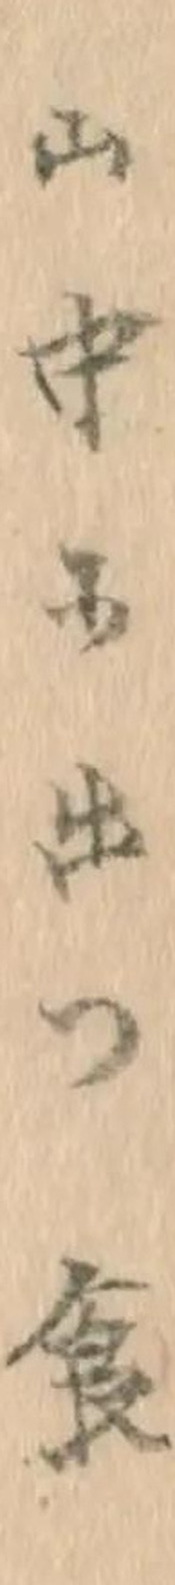山中に出つ食
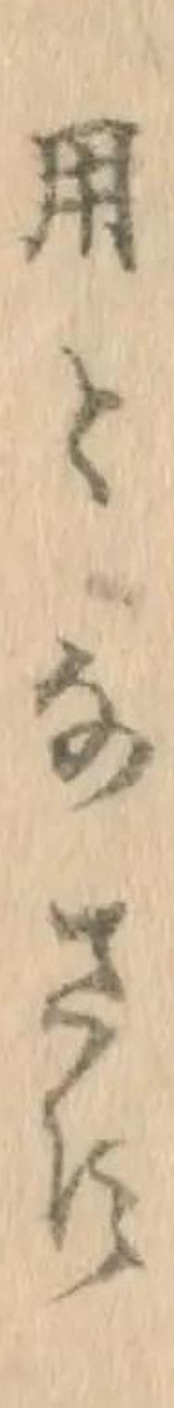用となさす
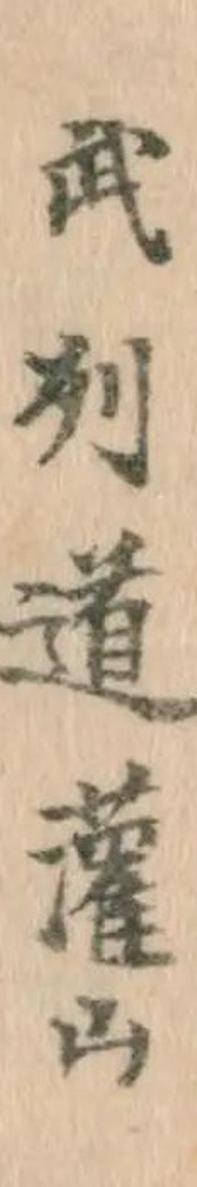武州道灌山
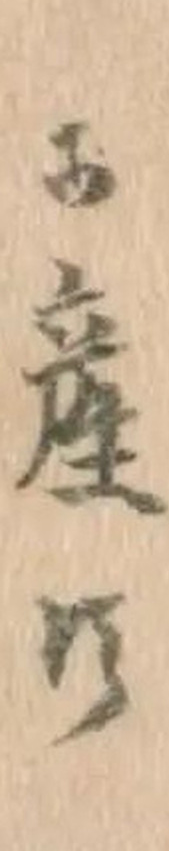に産す

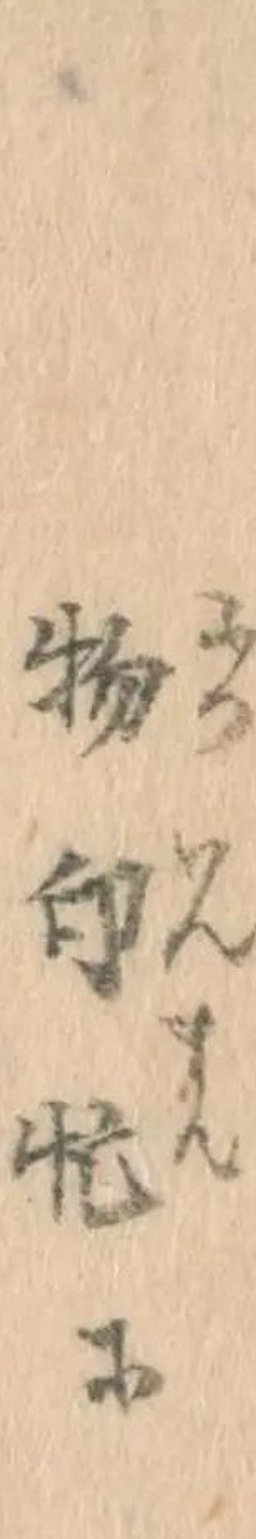物印忙に
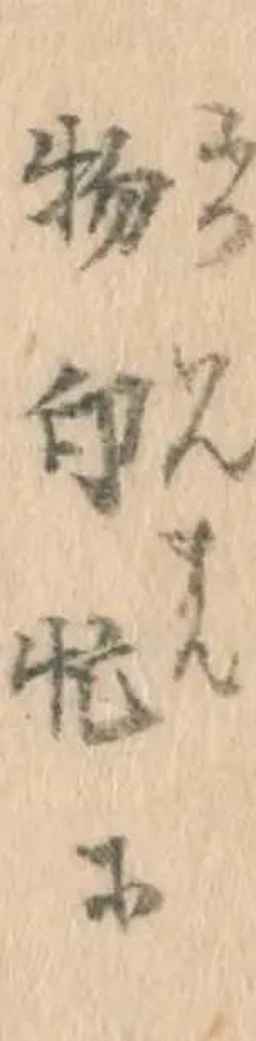物印忙に
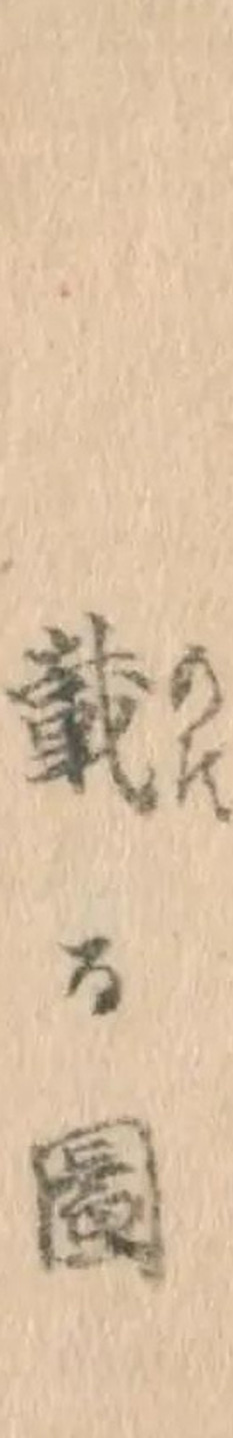載る図
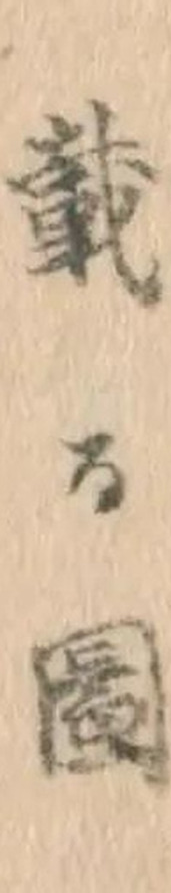載る図
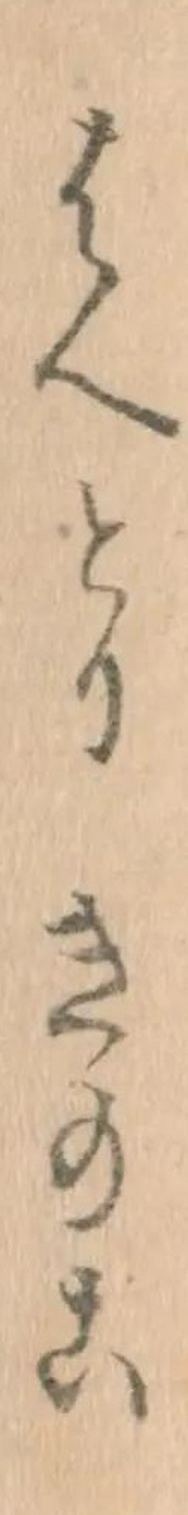はへとりきのこ
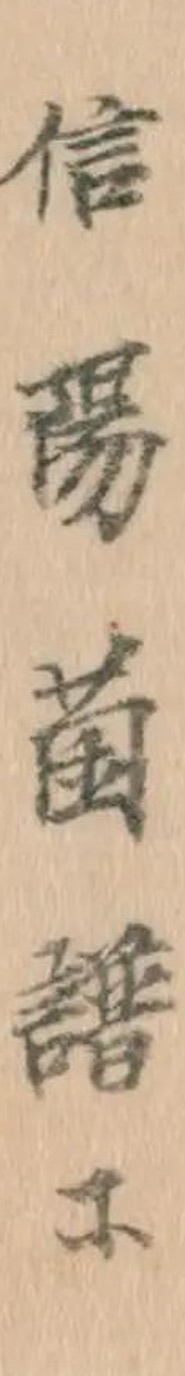信陽菌譜に
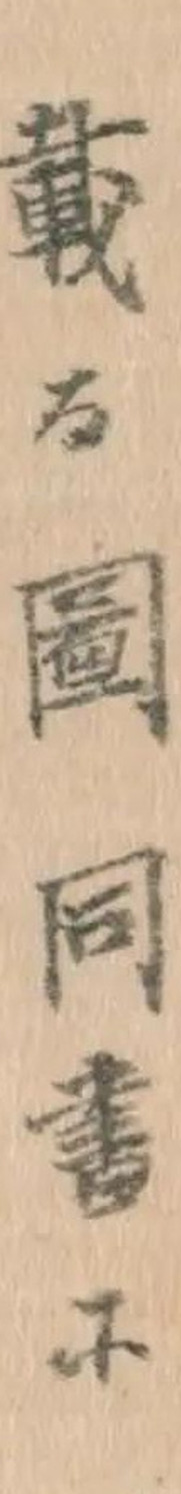載る図同書に
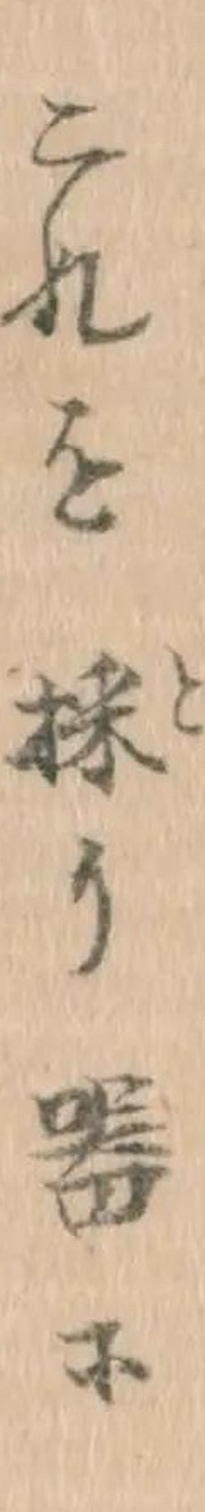これを採り器に
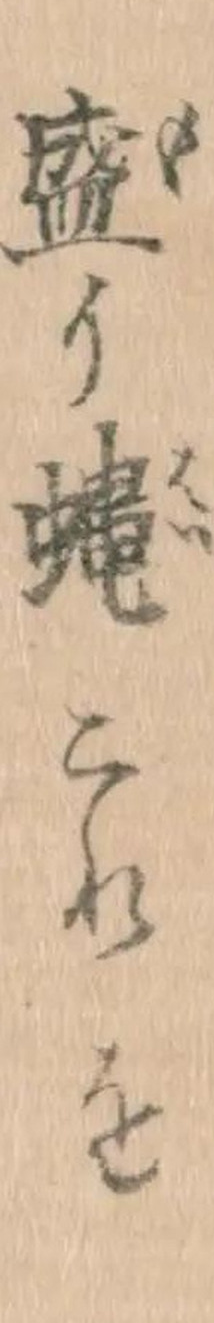盛り蠅これを
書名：本草図譜. 巻58-60
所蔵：国立国会図書館 National Diet Library, JAPAN
